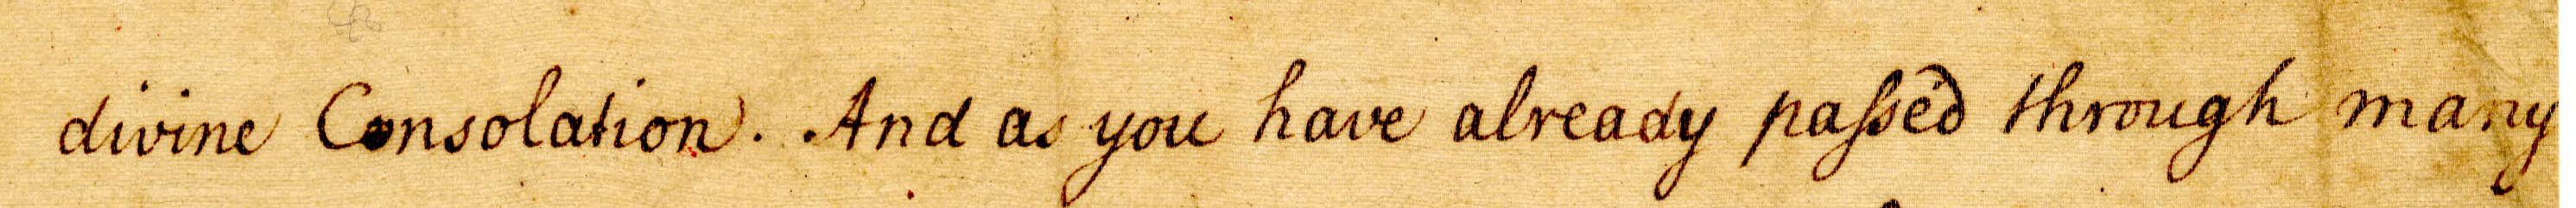divine Consolation. And as you have already passed through many
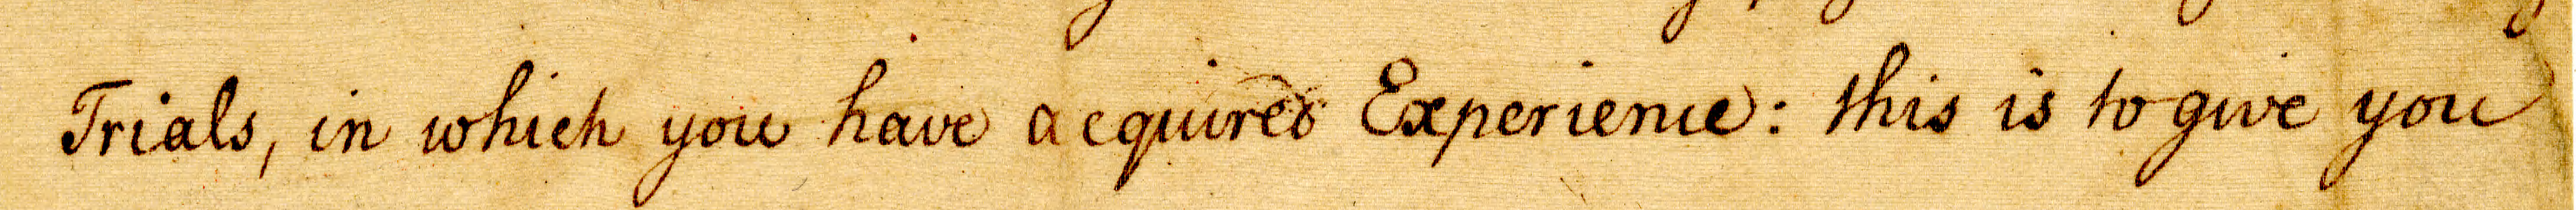Trials, in which you have acquired Experience: this is to give you
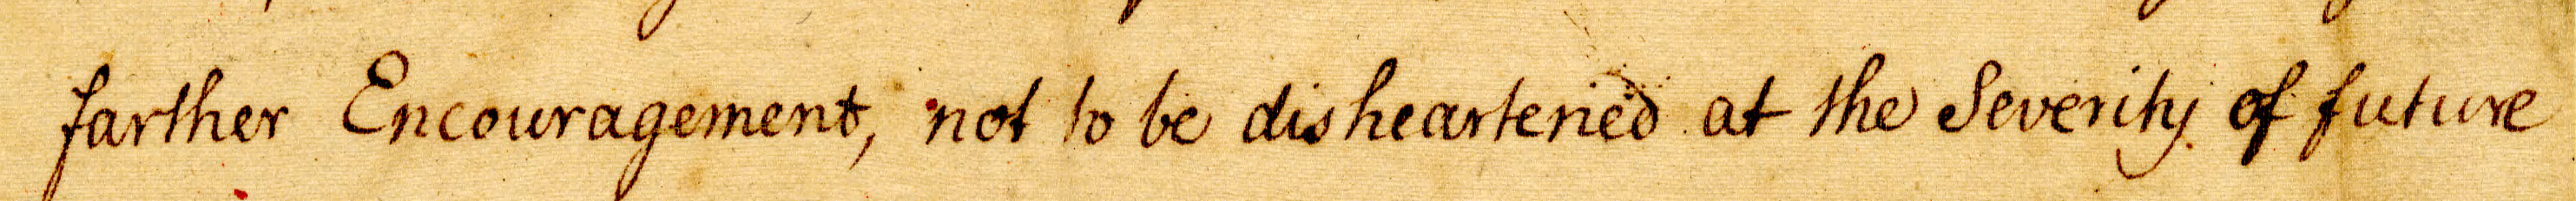farther Encouragement, not to be disheartened at the Severity of future
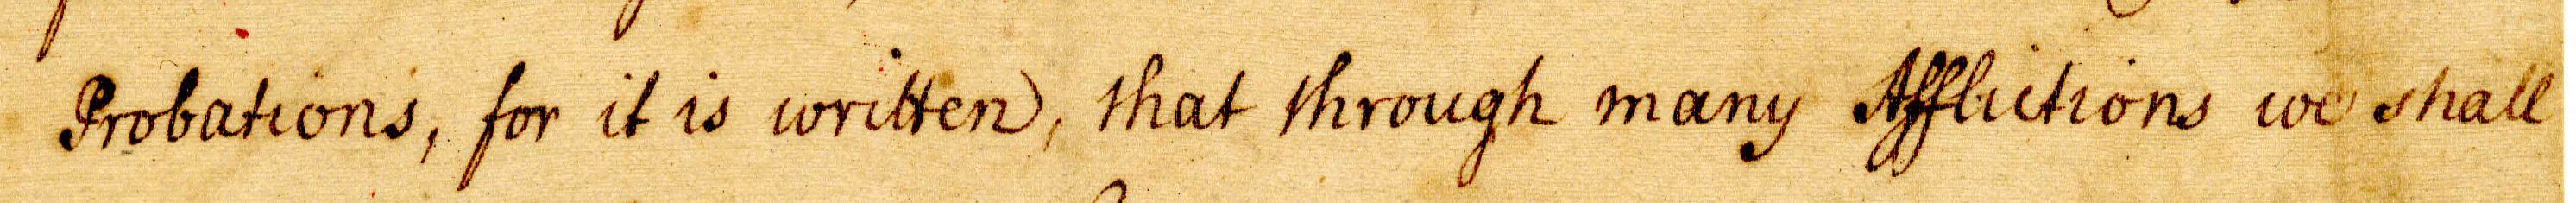Probations, for it is written, that through many Afflictions we shall
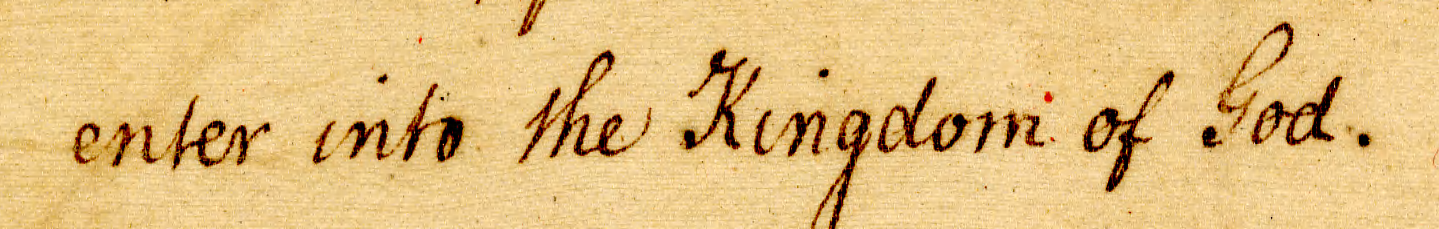Enter into the Kingdom of God.
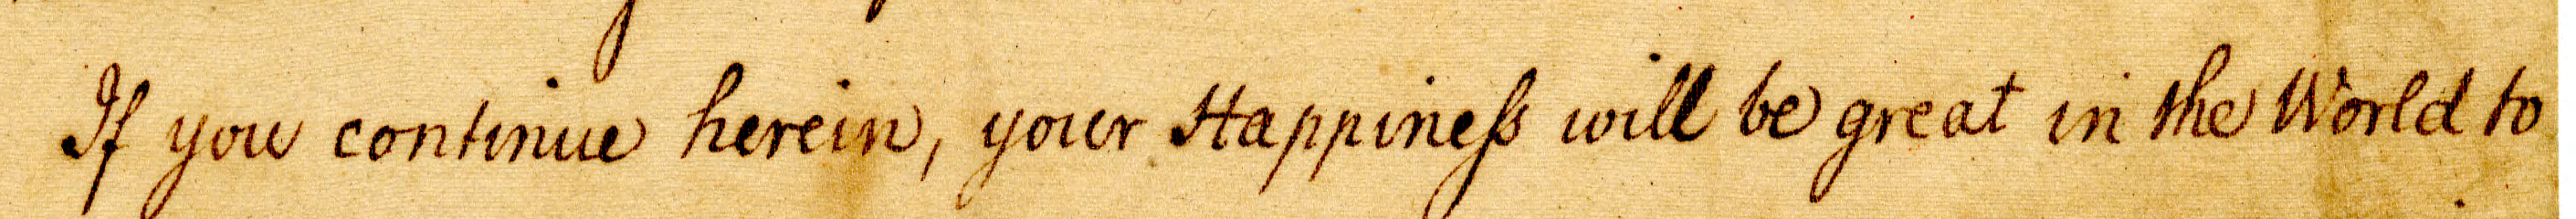If you continue herein, your Happiness will be great in the World to
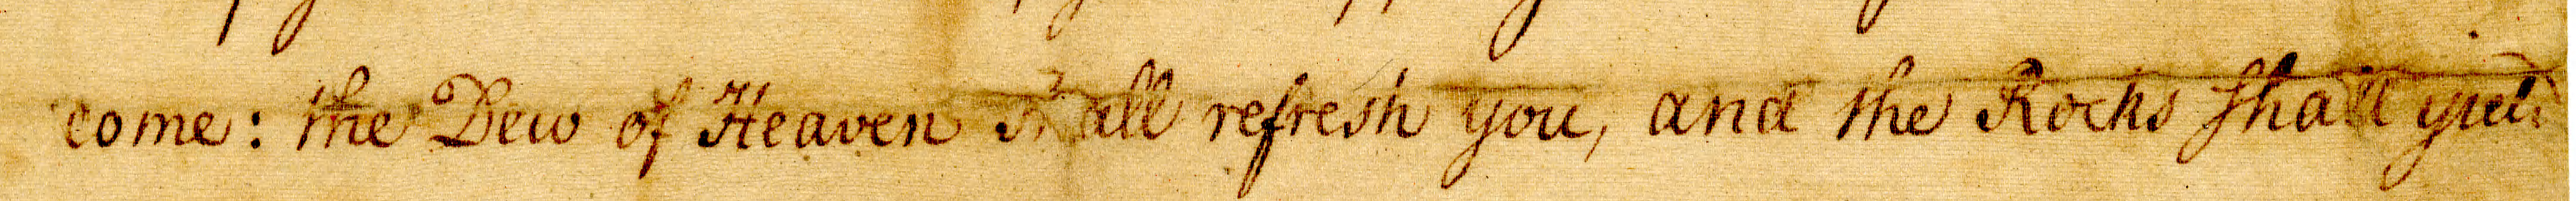come: the Dew of Heavens shall refresh you, and the Rocks shall yield
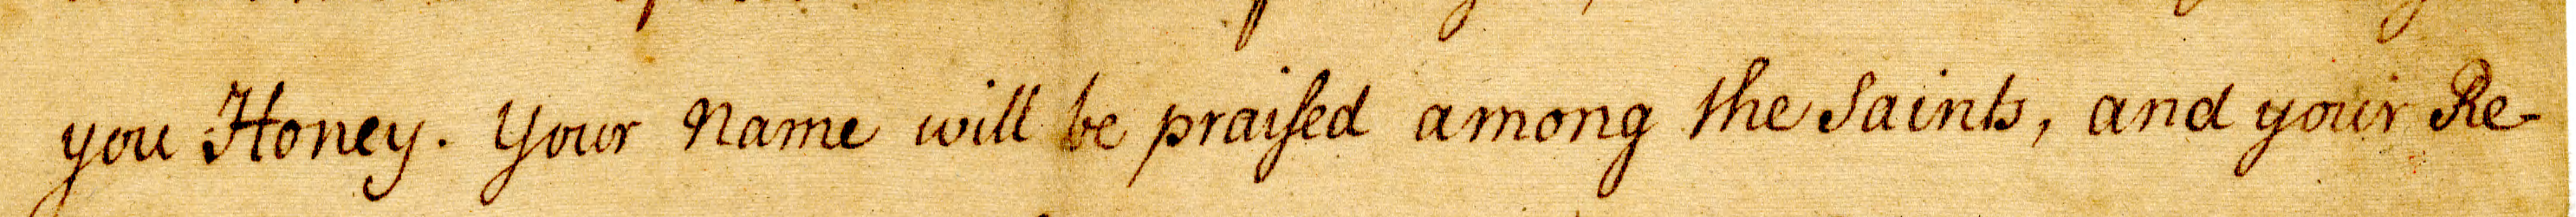you Honey. Your name will be praised among the Saints, and your Re-
